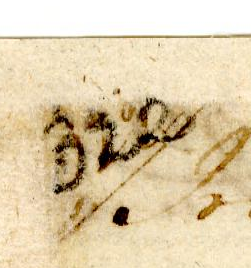322
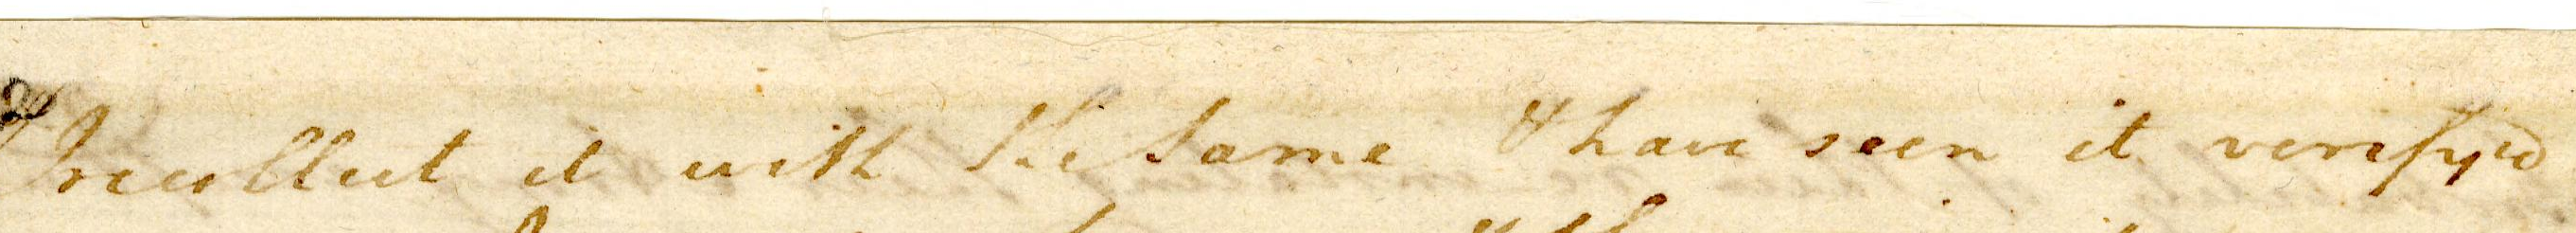I recollect it with the same & have seen it verify'd
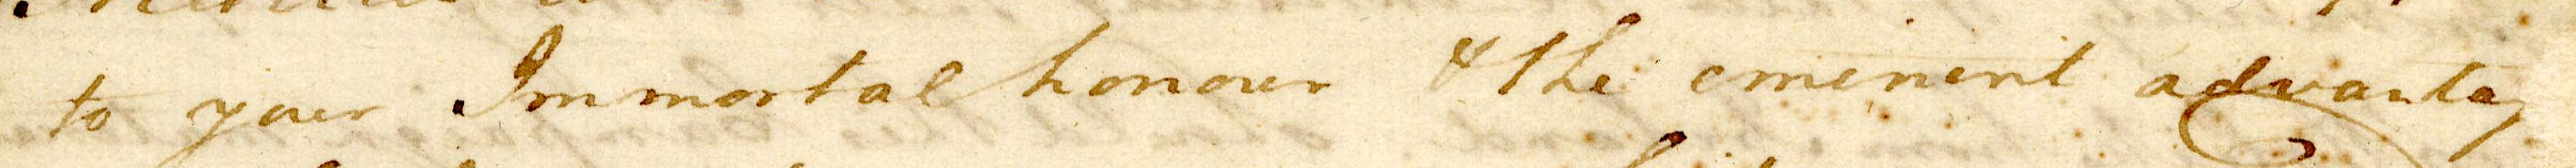to your Immortal honour & the eminent advantage
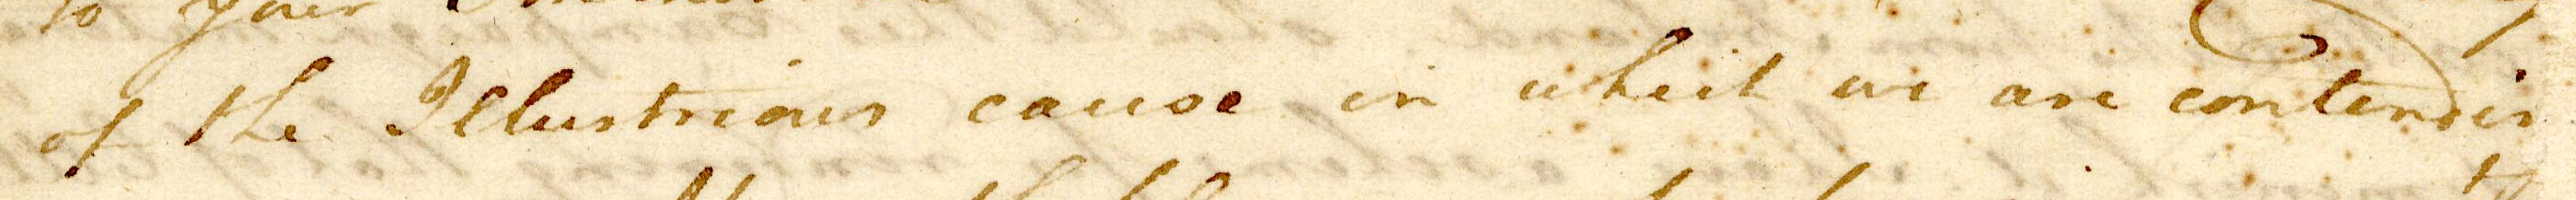of the Illustrious cause in which we are contend in
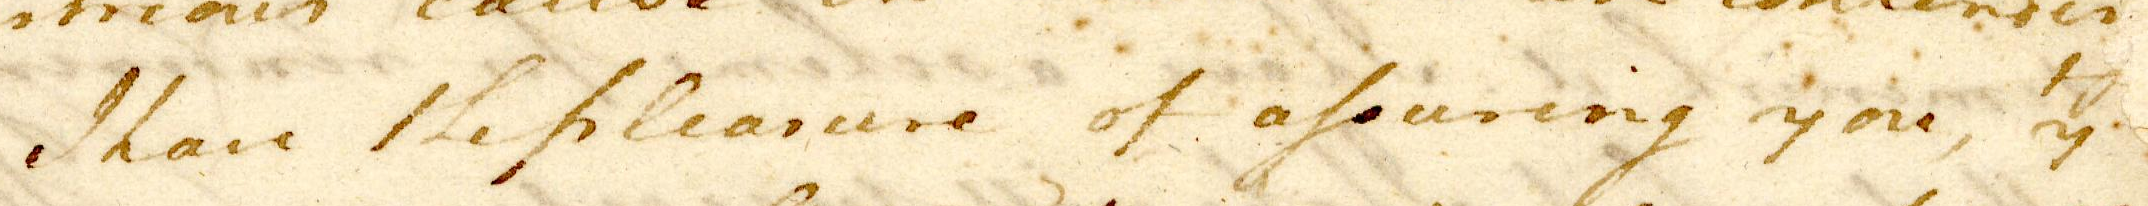I have the pleasure of assuring you, to
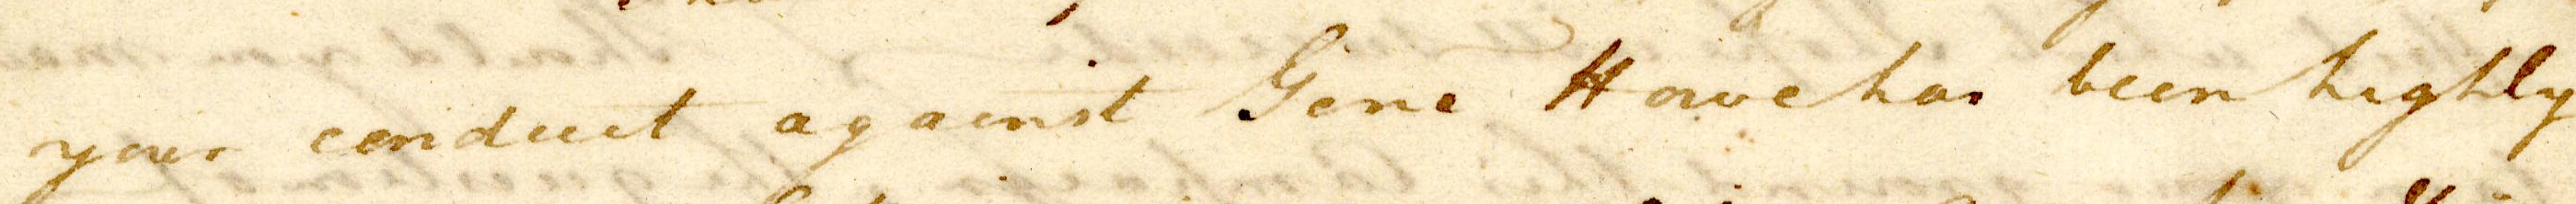your conduct against Gene Howe has been highly
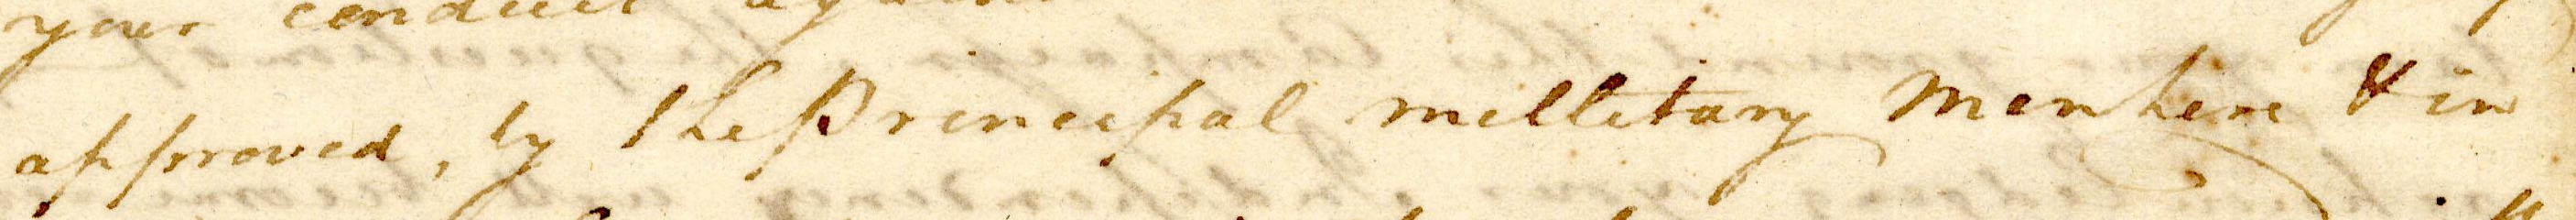approved, by the principal Military men here & in
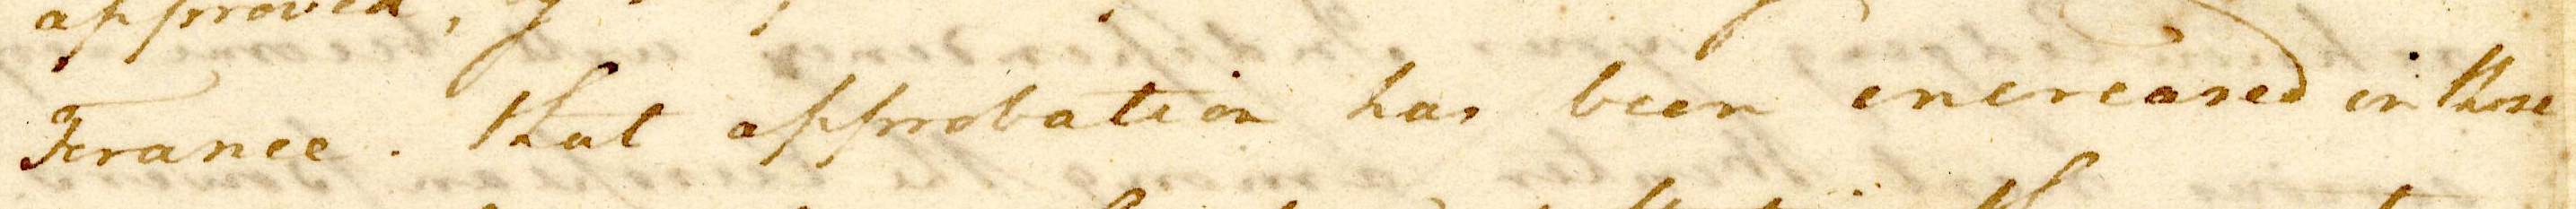France. That approbation has been increased in those
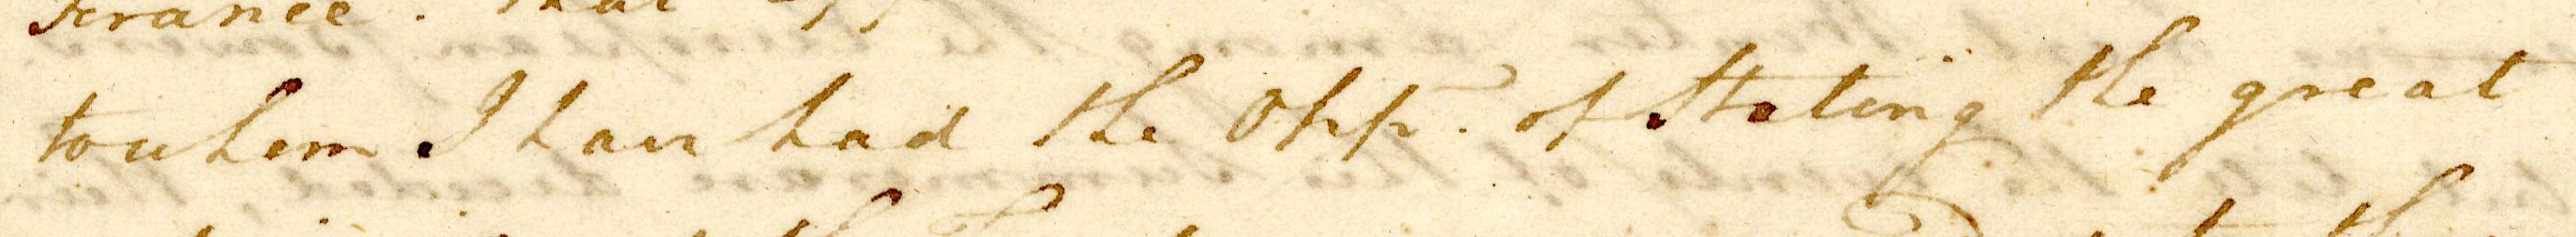to whome I have had the Opp^y. of stating the great
